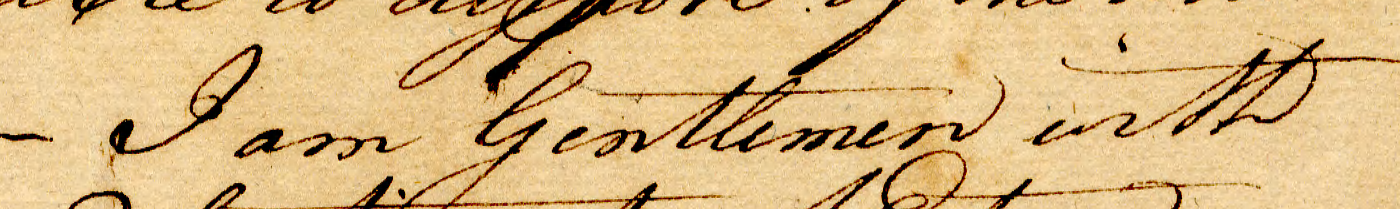I am Gentlemen with
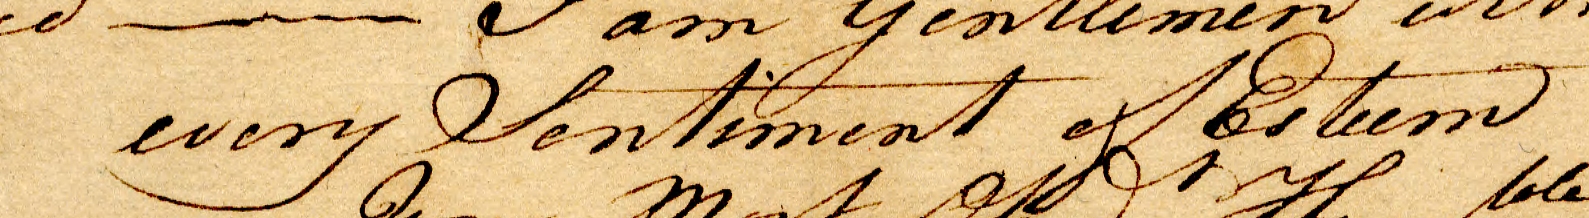every Sentiment of Esteem
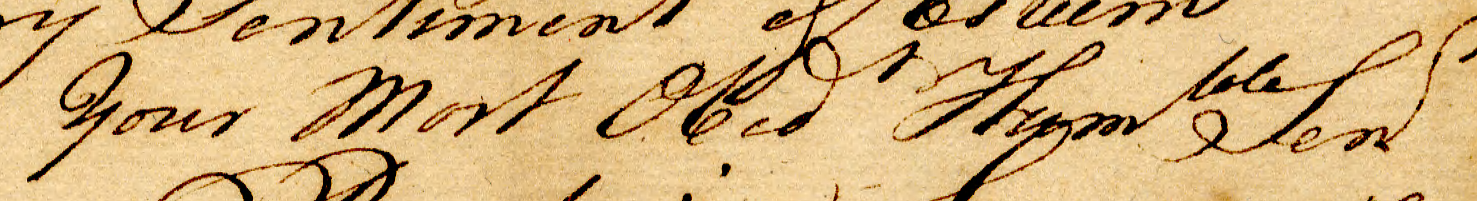Your Most Obed^t Hum^ble Serv^t
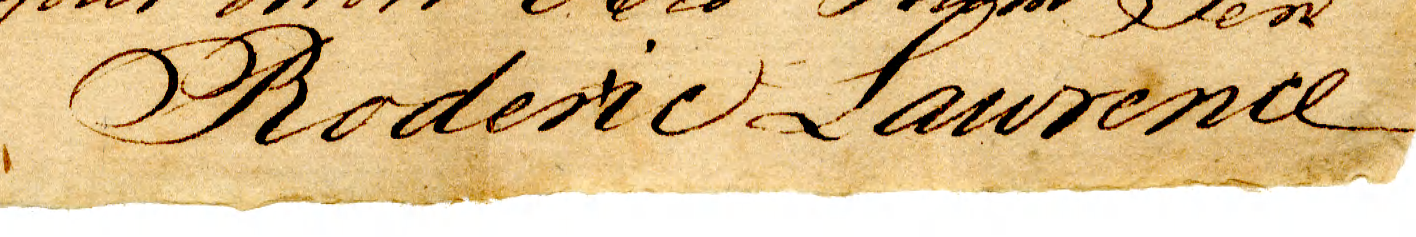Roderic Lawrence
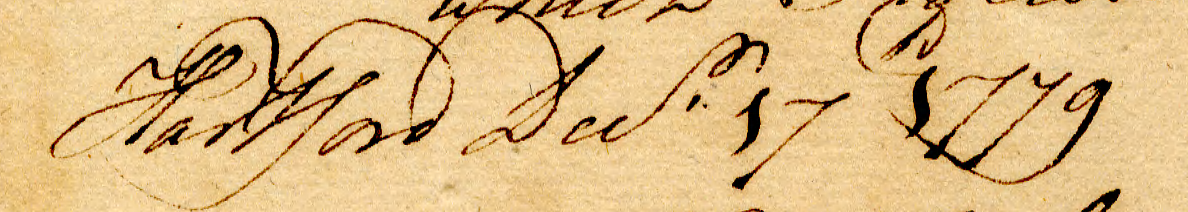Hartford Dec^r. 17 1779
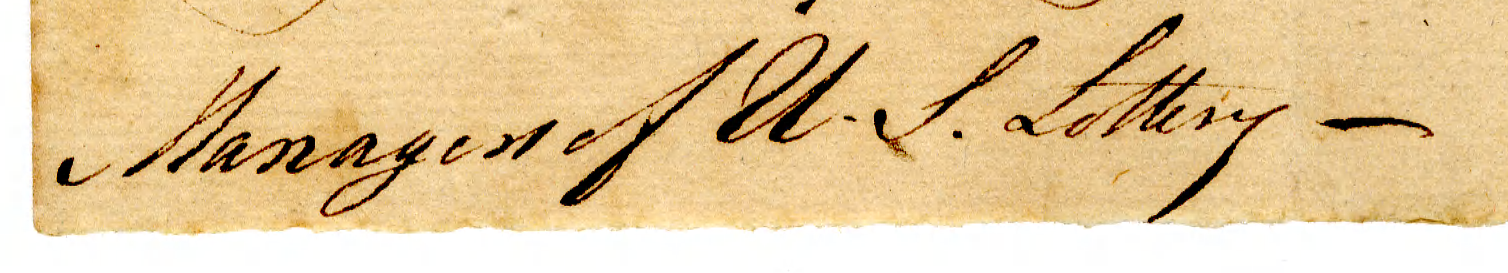Manager of U.S. Lottery-
